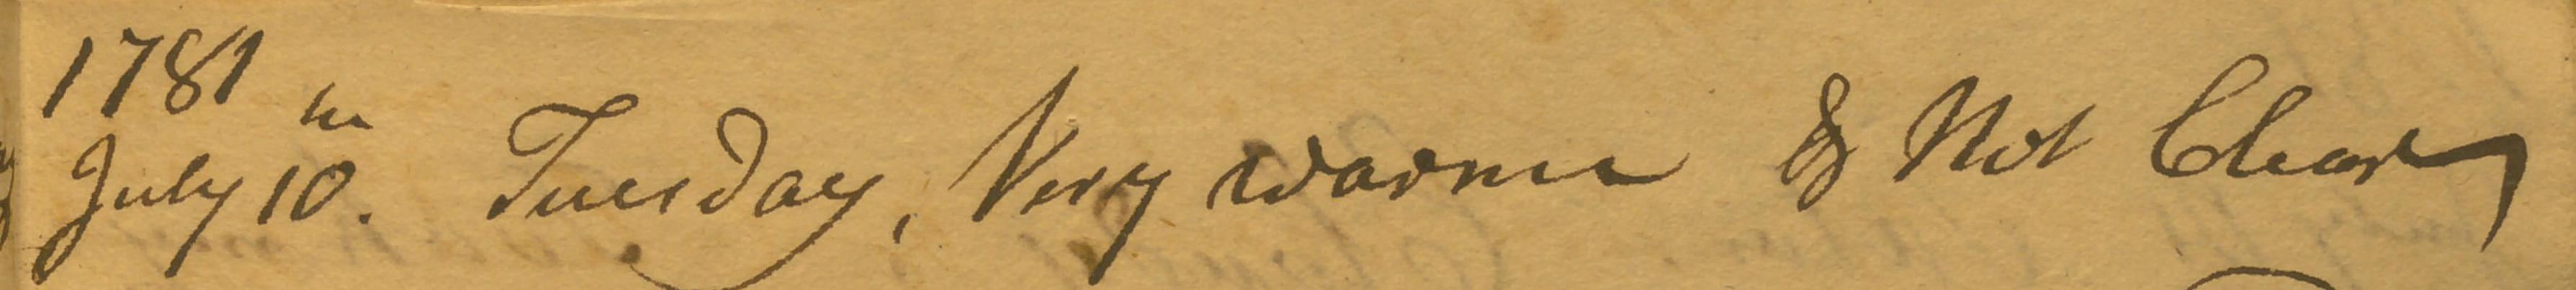July 10^th. Tuesday, Very warme & Not Clear
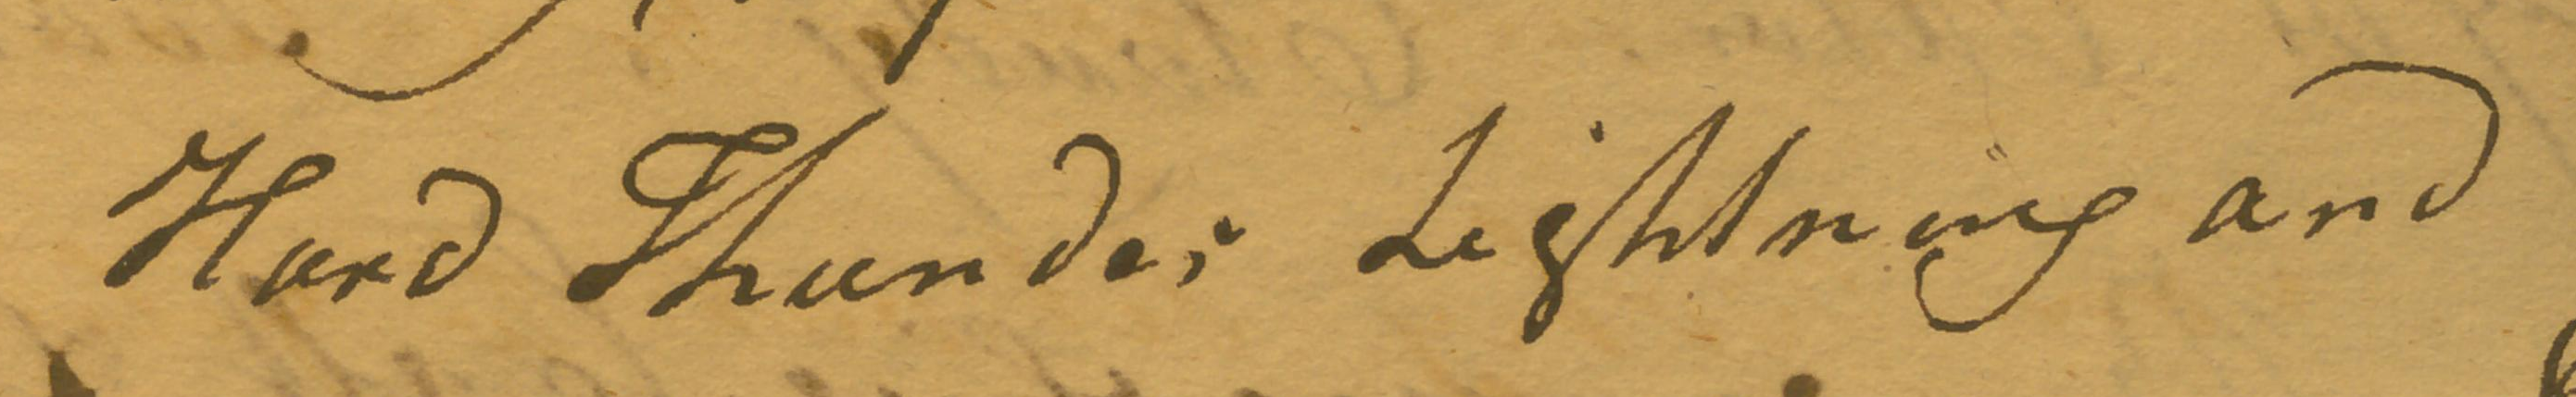Hard Thunder Lightning and
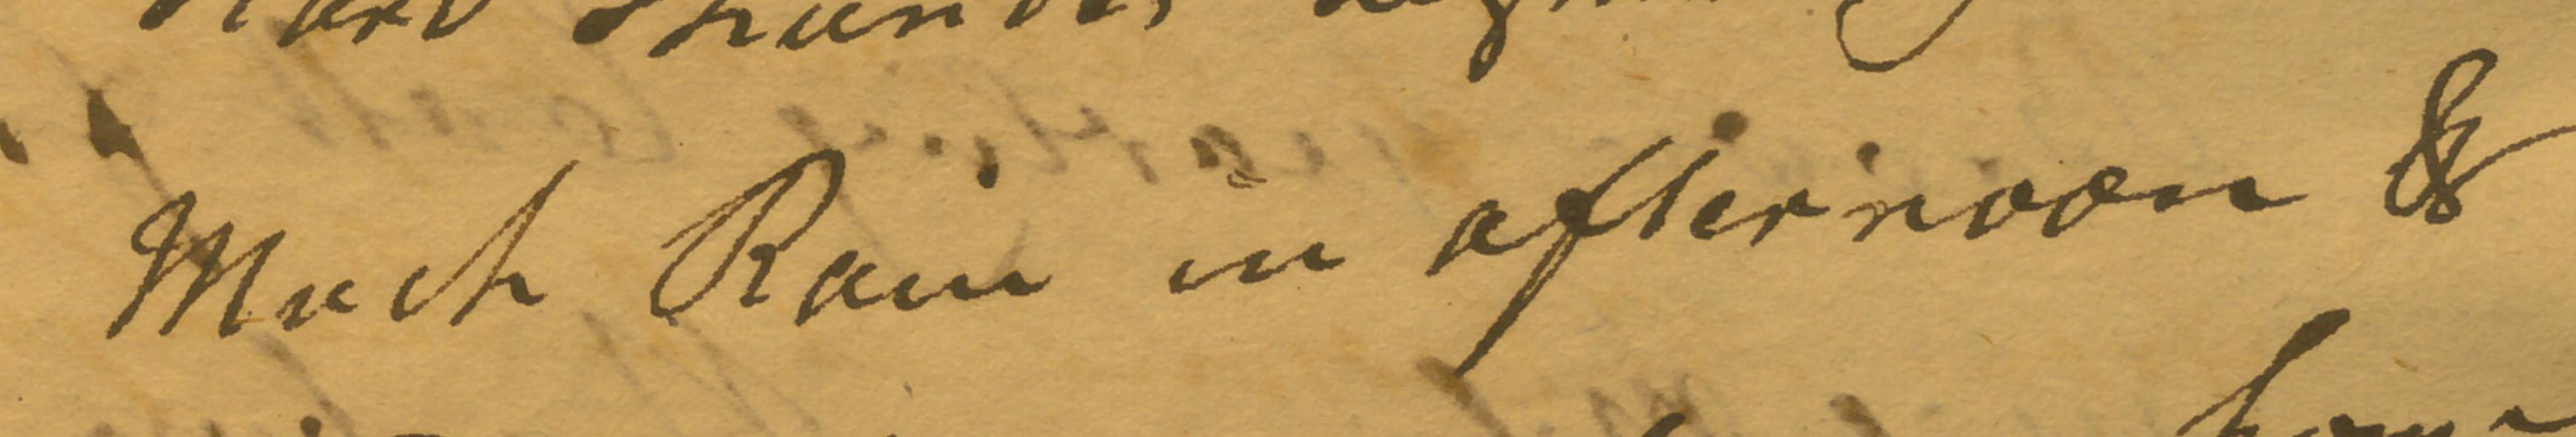Much Rain in afternoon &
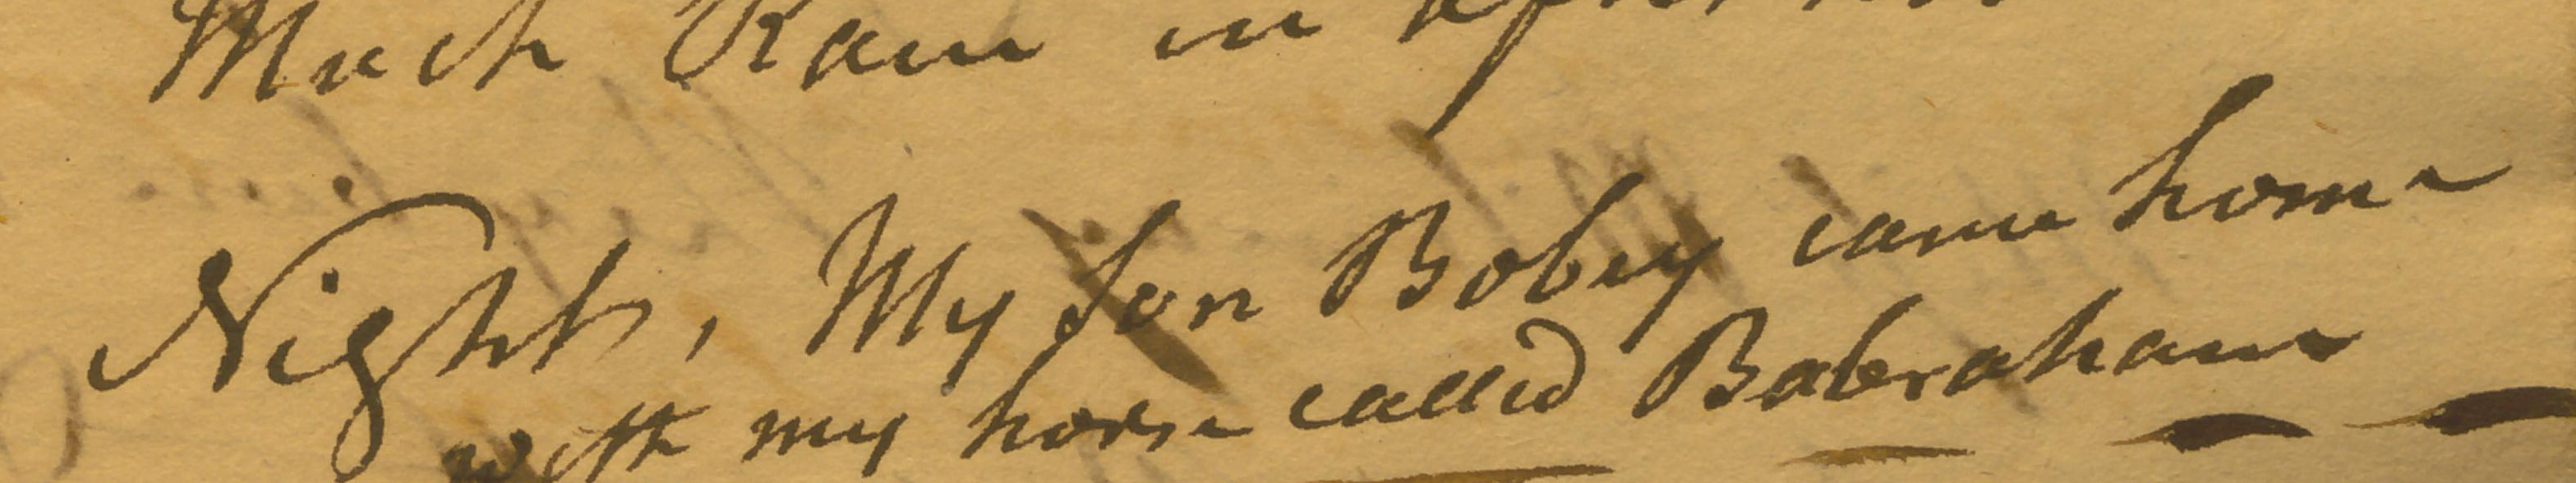Night, My fon Bobey came home
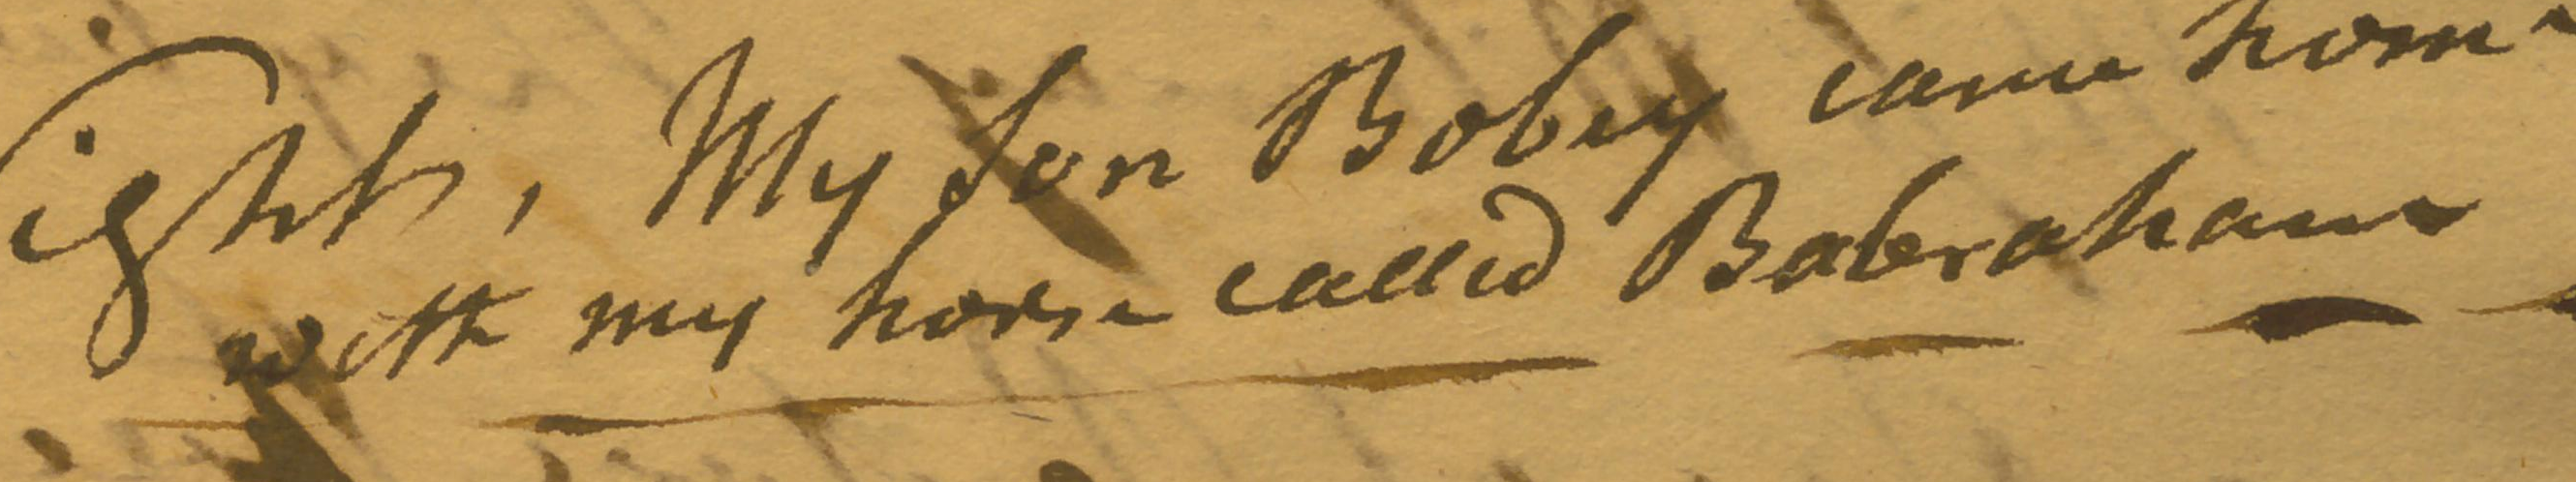with my horse called Babraham
